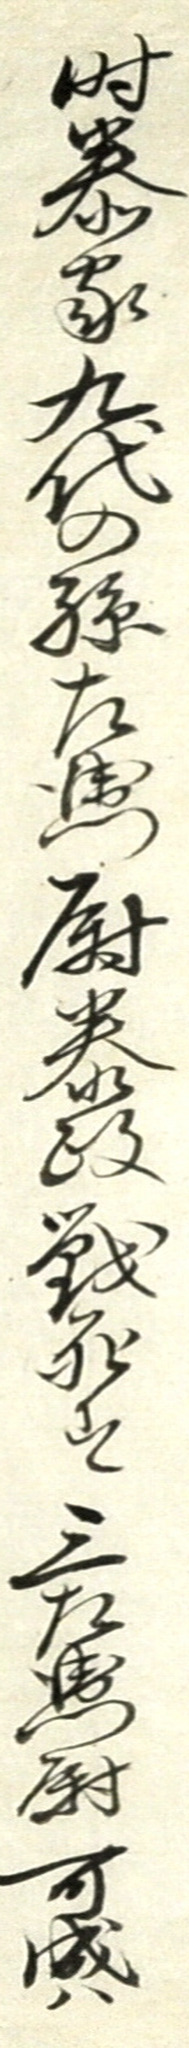時泰家九代の孫左衛門尉泰政戦死す三左衛門尉可成は
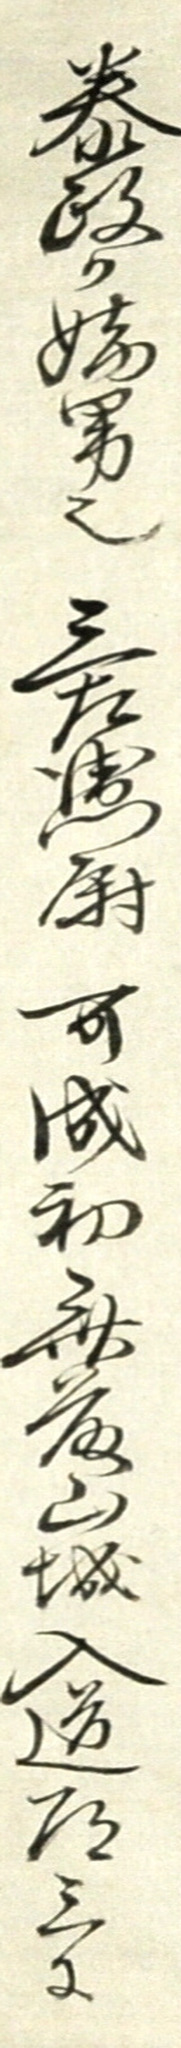泰政か嫡男也三左衛門可成初斎藤山城入道道三に
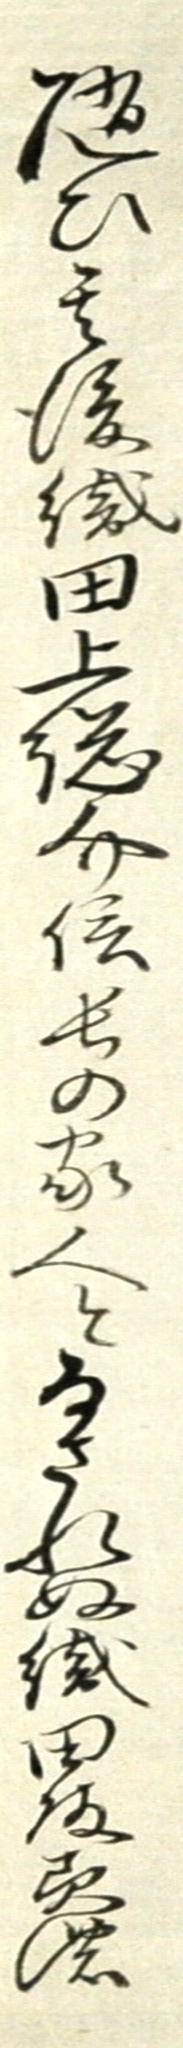随ひ其後織田上総介信長の家人となされぬ織田殿美濃
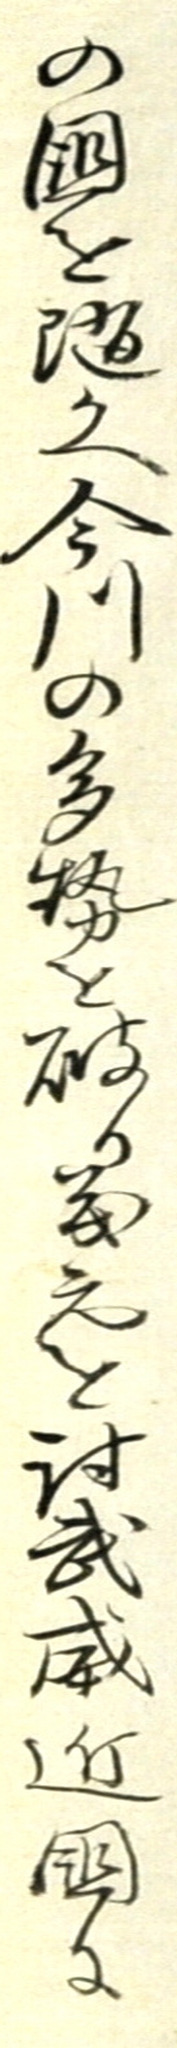の国を随かへ今川の多勢を破り義元を討武威近国に

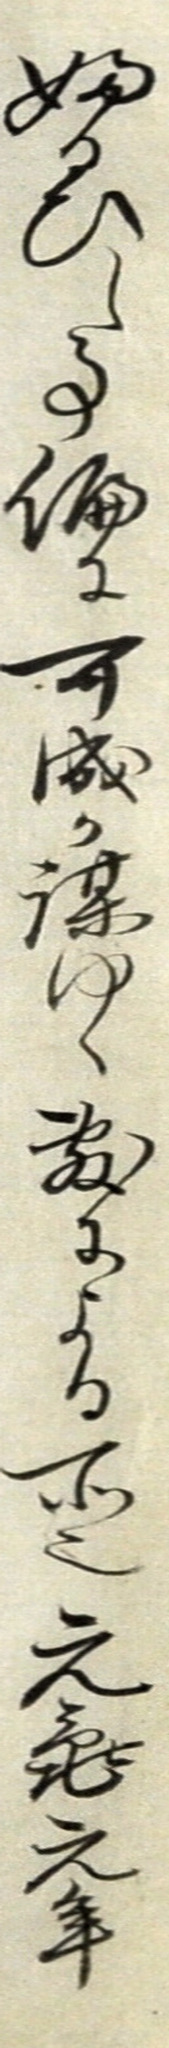ふるひし事偏に可成か謀ゆゝ敷による所也元亀元年
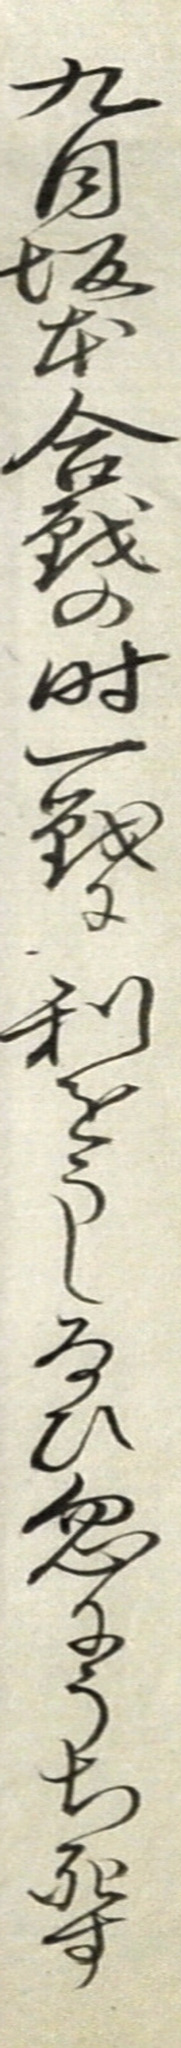九月坂本合戦の時一戦に利をうしなひ忽にうち死す
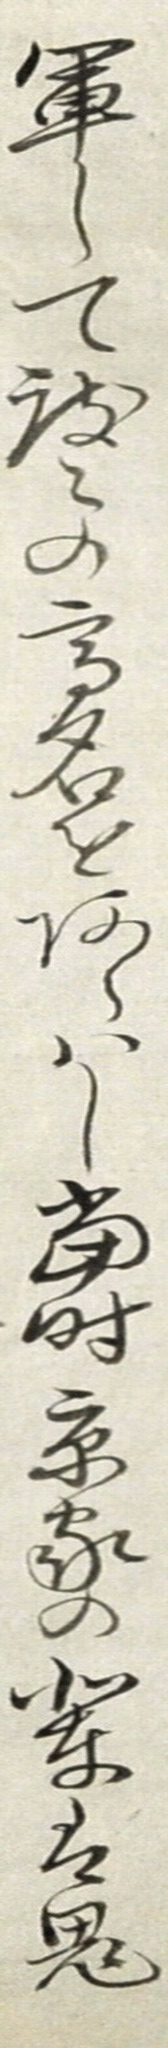軍して度々の高名をあらはし当時京家の輩は鬼
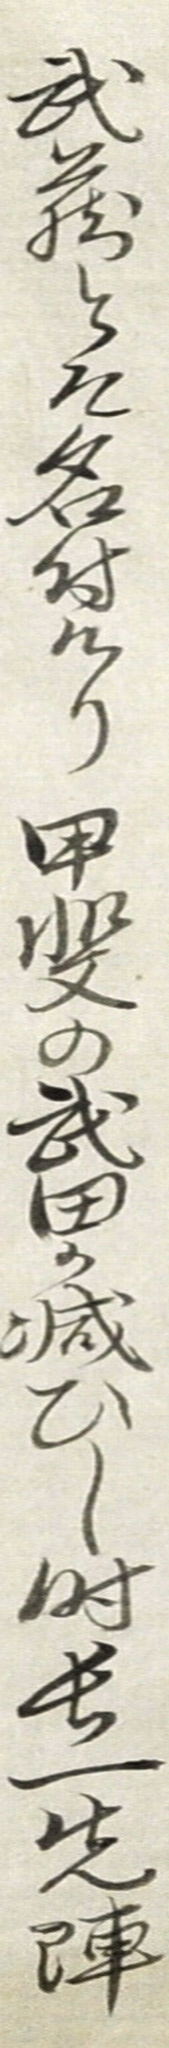武蔵とそ名付けり甲斐の武田か滅ひし時長一先陣
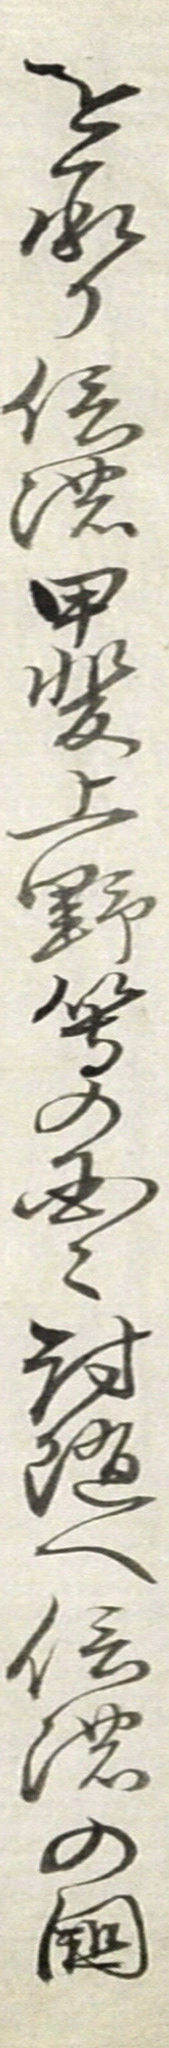を承り信濃甲斐上野等の国々討随へ信濃の国
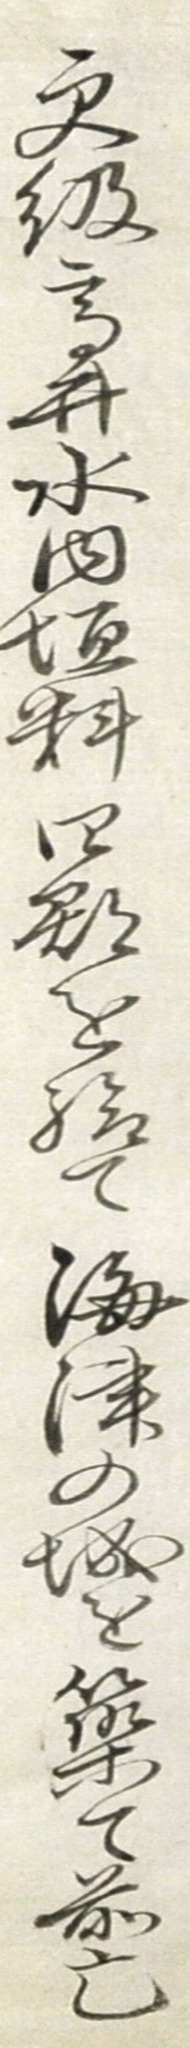更級高井水内垣料四郡を給て海津の城を築て前亡
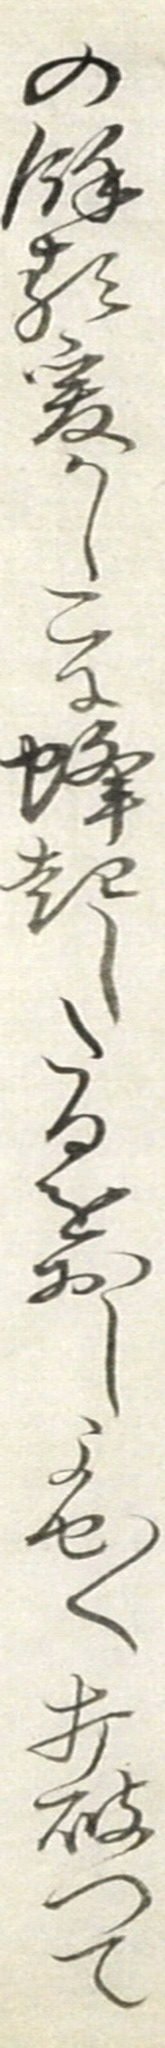の余類爰かしこに蜂起したるをおしよせ〳〵打破つて
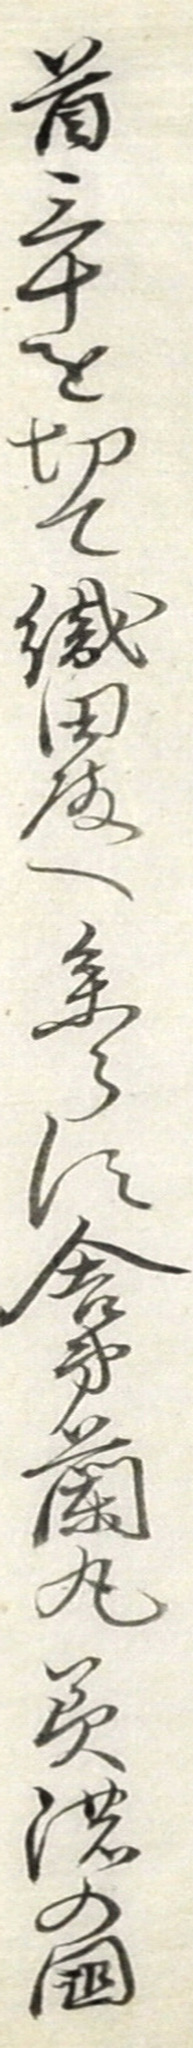首三十を切て織田殿へ参らす舎弟蘭丸美濃の国
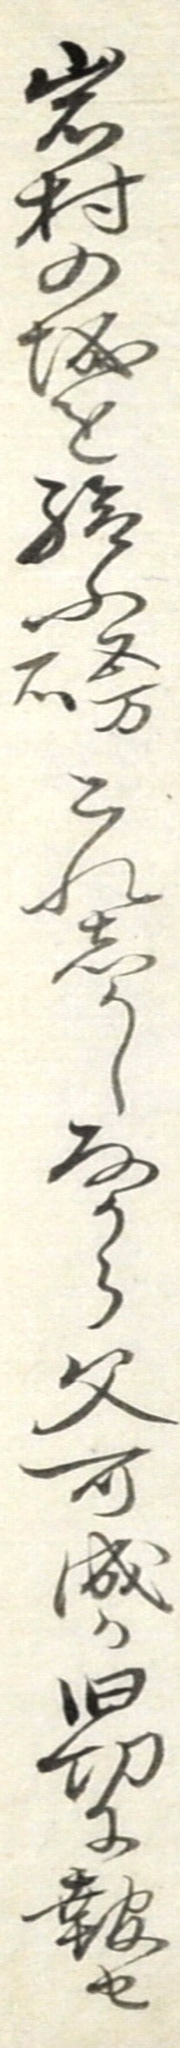岩村の城を給ふ五万石これしかしなから父可成か旧功に報せ
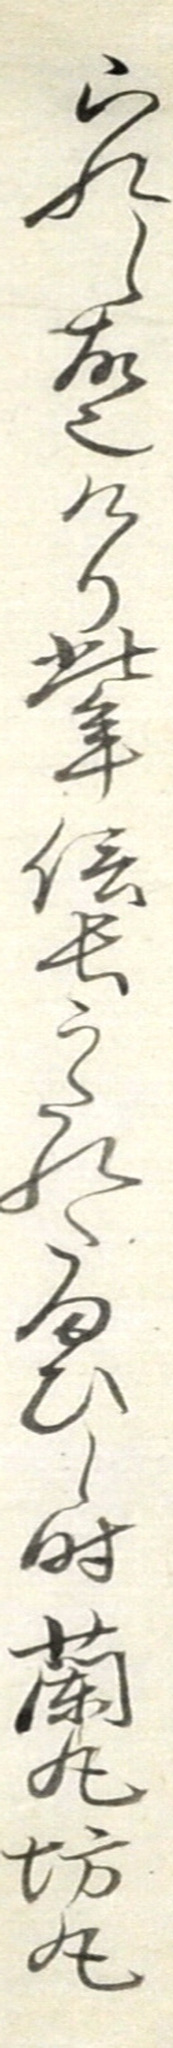られし故也けり此年信長うたれたまひし時蘭丸坊丸
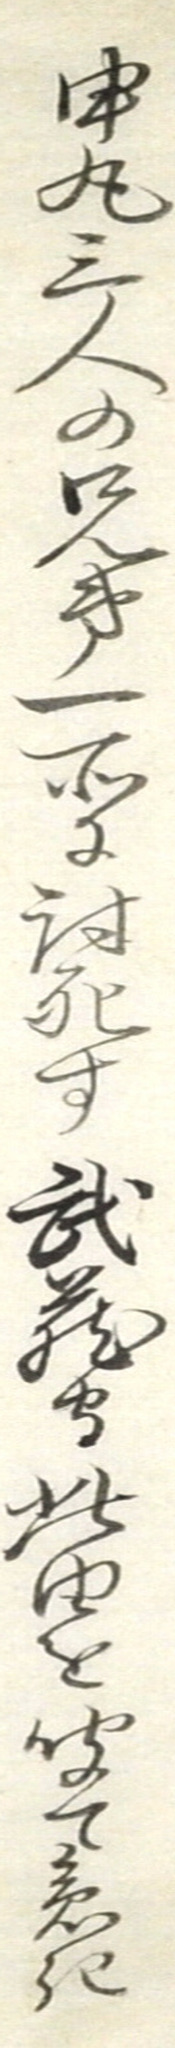申丸三人の兄弟一所に討死す武蔵守此由を聞て急き
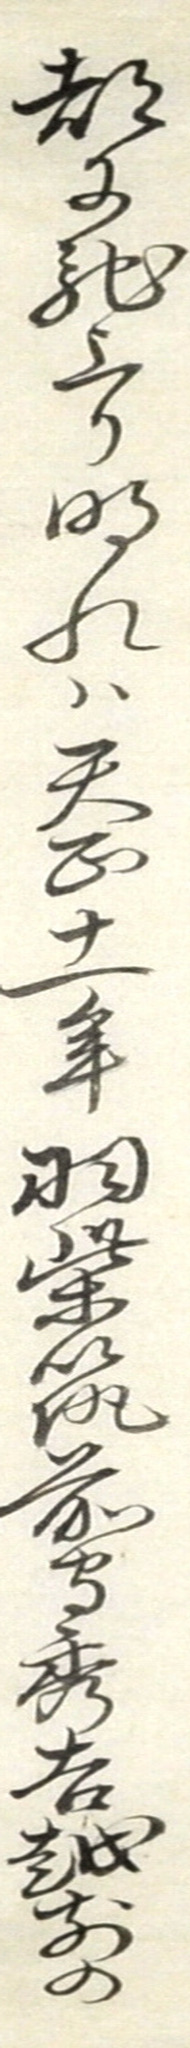都に馳上り明れは天正十一年羽柴筑前守秀吉越前の
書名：藩翰譜（七・下）
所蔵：伊那市立高遠町図書館・合同会社AMANE
